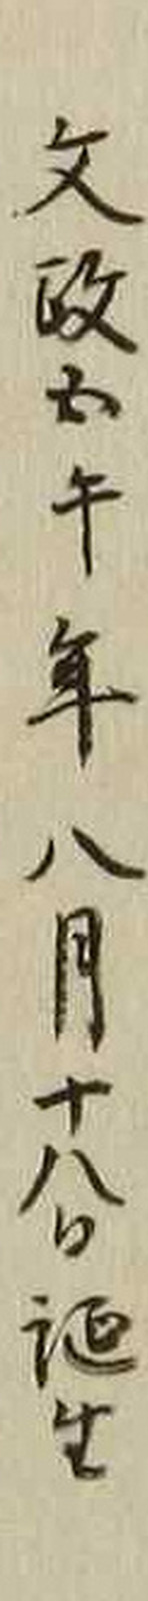勝吾文政五午年八月十八日誕生
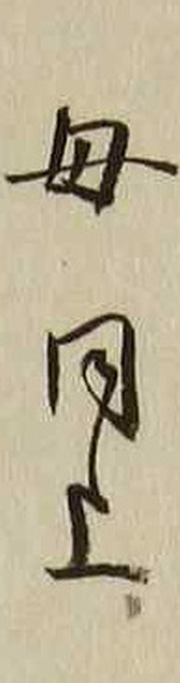母同上
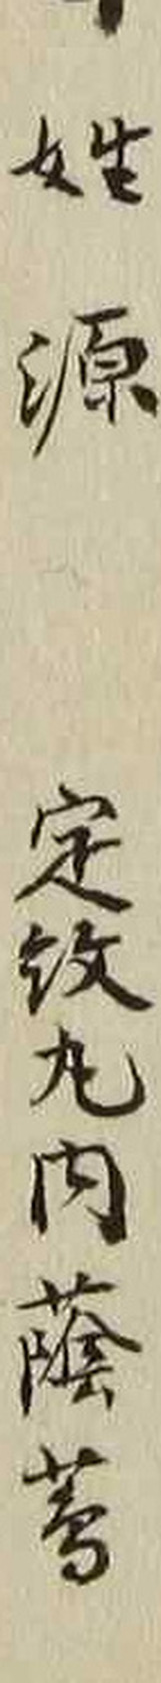姓源定紋丸内蔭蔦
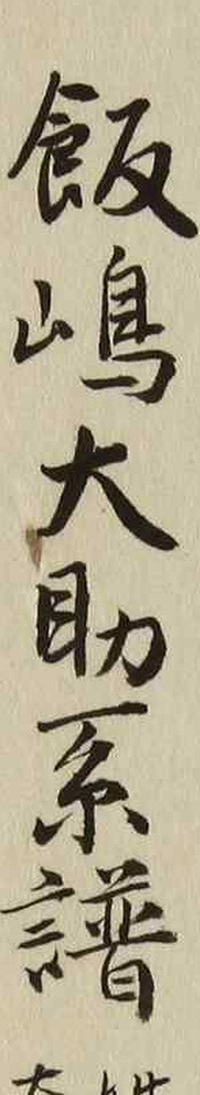飯島大助系譜
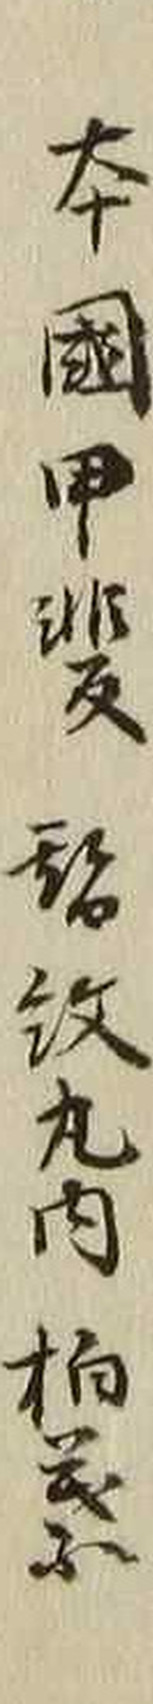本国甲斐替紋丸内柏葉
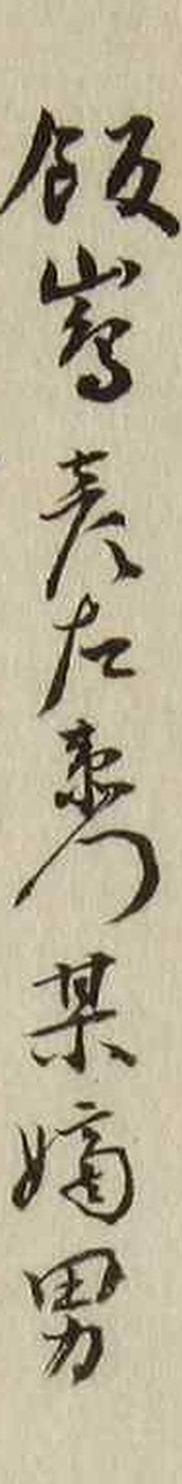飯嶋彦左衛門某嫡男
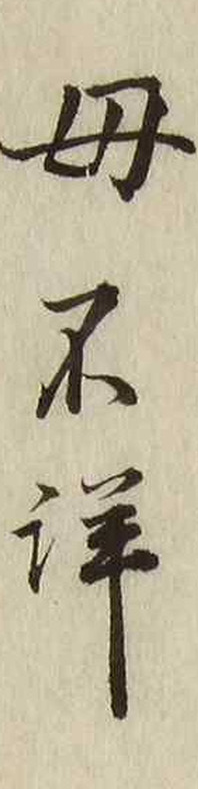母不詳
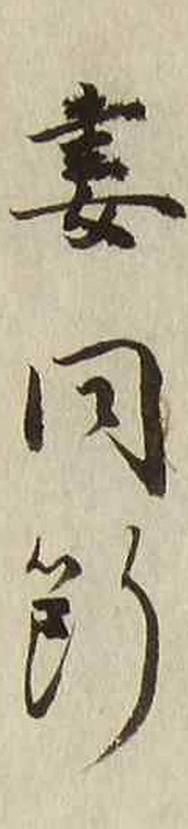妻同断
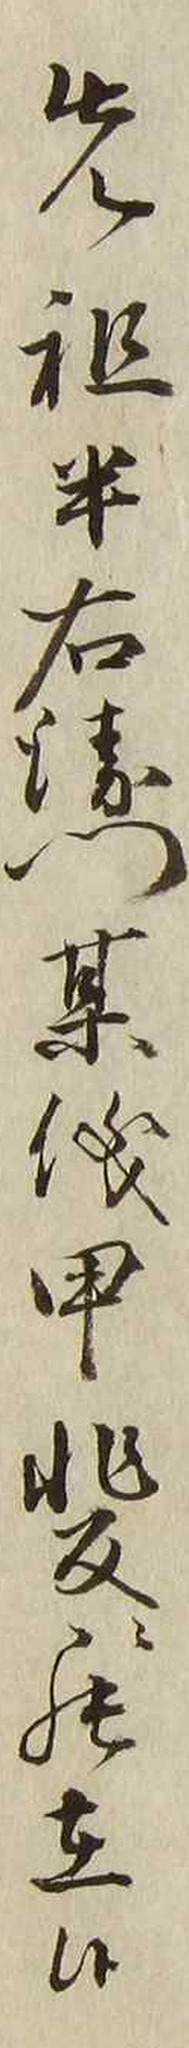先祖半右衛門某儀甲斐ニ罷り在候

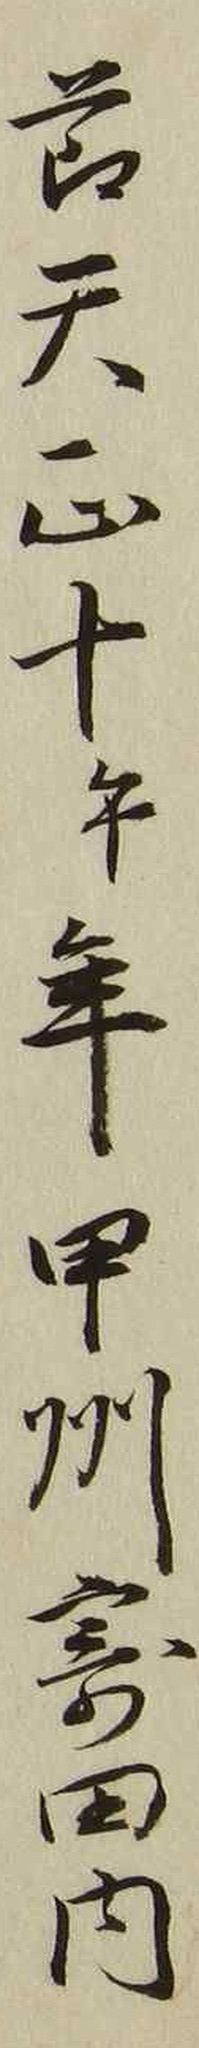節天正十午年甲州寄田内
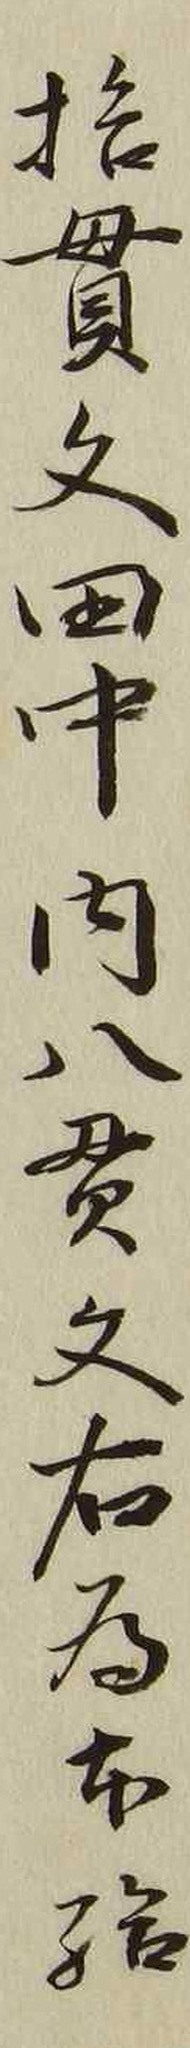拾貫文田中内八貫文右本給
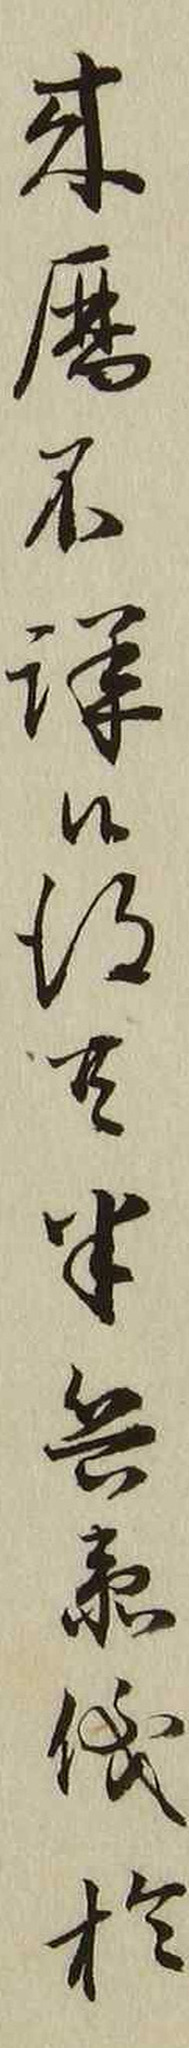来歴不詳候得ば半兵衛儀
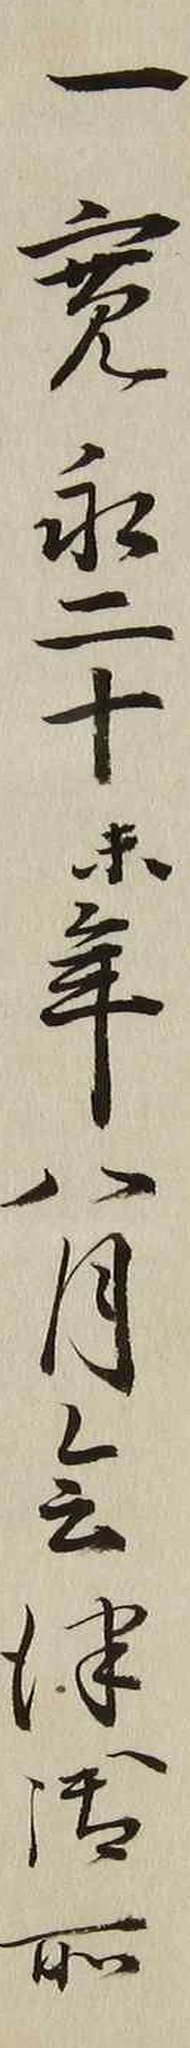一寛永二十未年八月会津へ御所
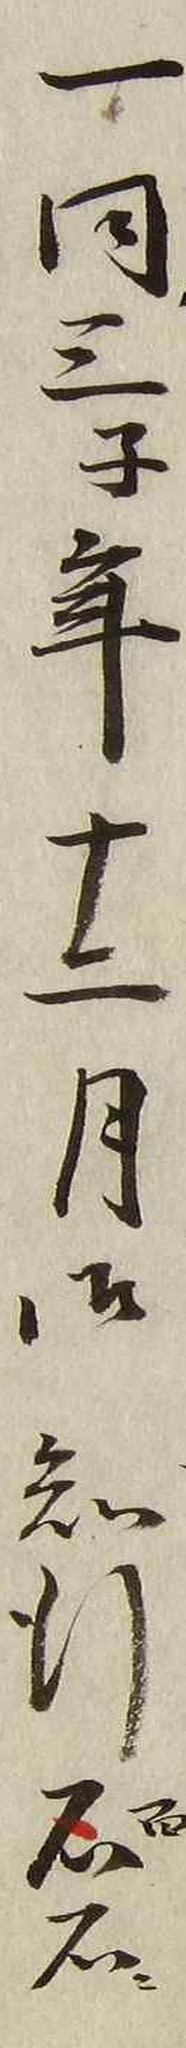一同三子年十二月御知行百石

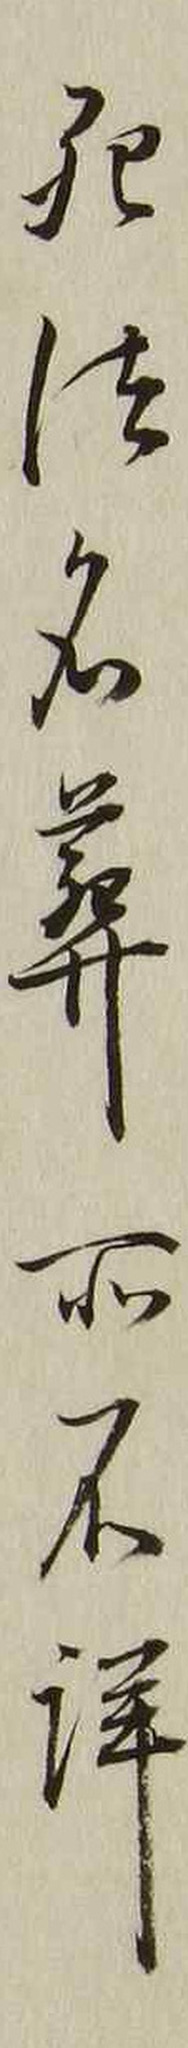死法名葬所不詳
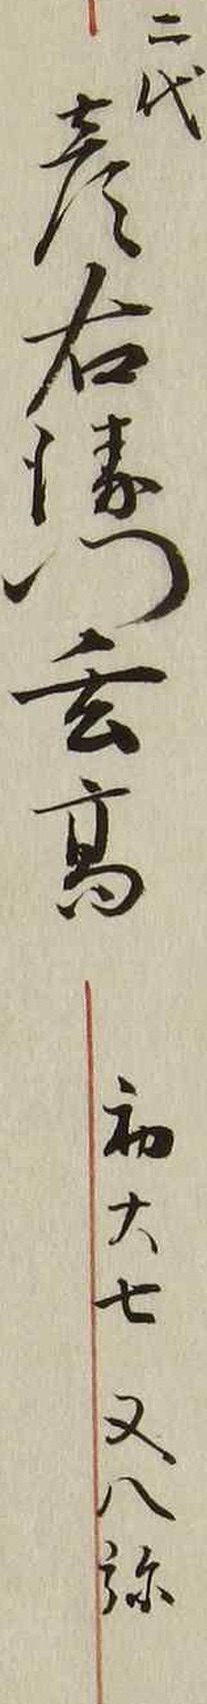彦右衛門玄高初大七又八弥
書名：諸士系譜　巻之19　い之部19
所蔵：会津若松市立会津図書館
